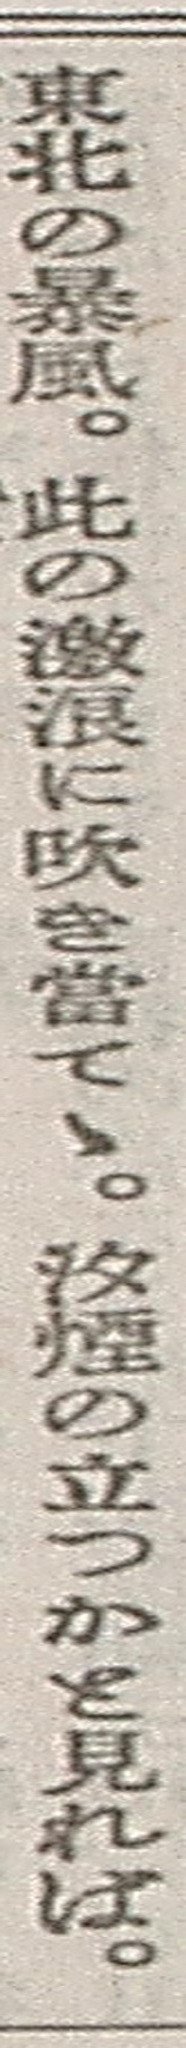東北の暴風。此の激浪に吹き当てゝ。汐煙の立つかと見れば。
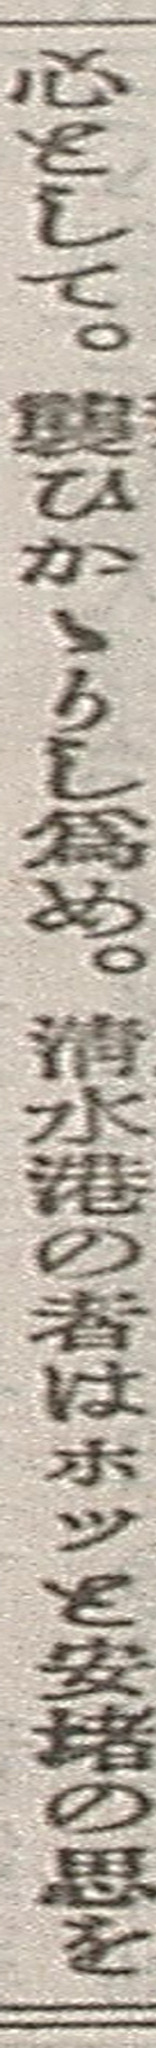心として。襲ひかゝりし為め。清水港の者はホツと安堵の思を
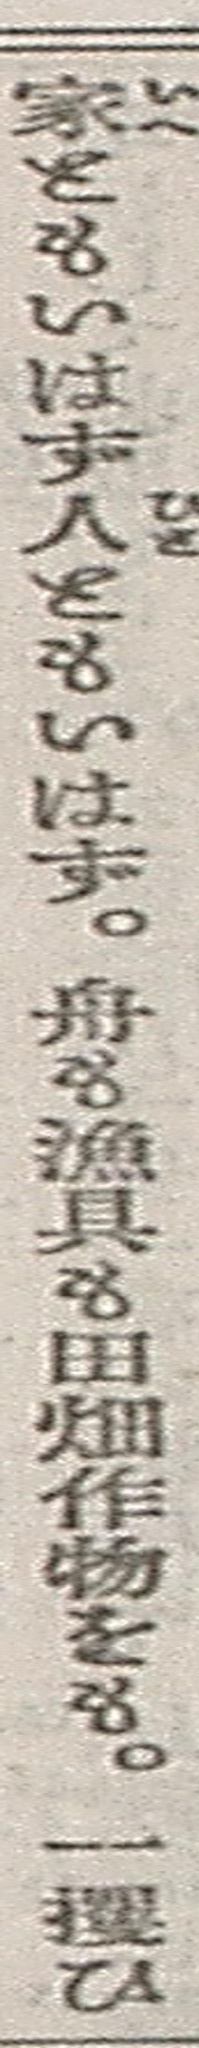家ともいはず人ともいはず。舟も漁具も田畑作物をも。一攫ひ
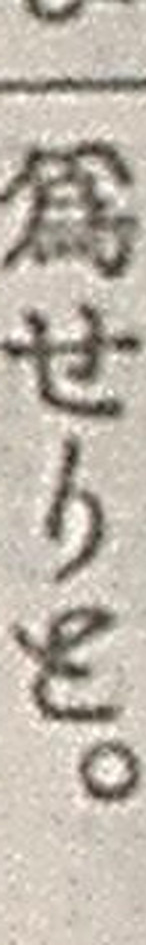為せりと。
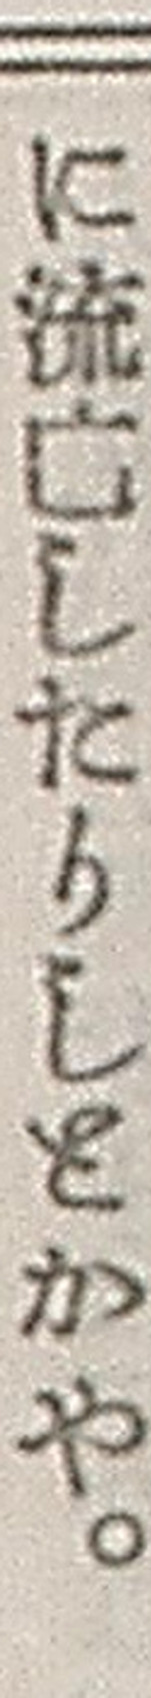に流亡したりしとかや。
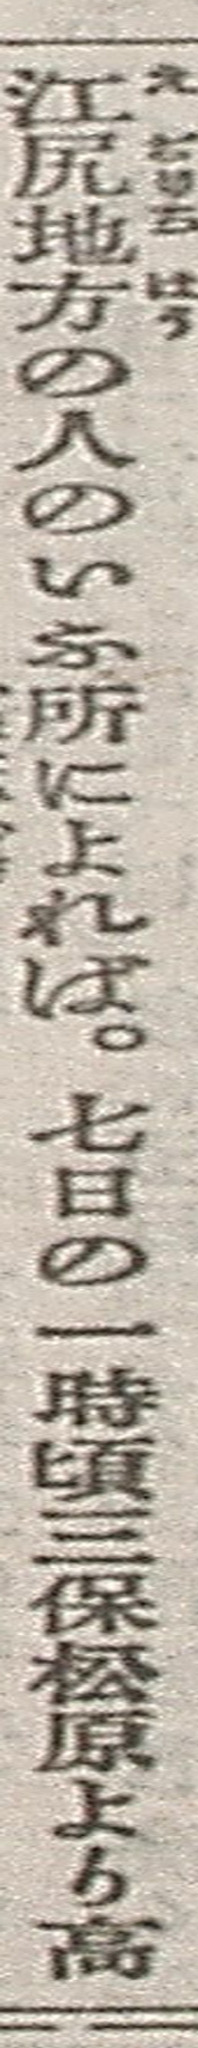江尻地方の人のいふ所によれば。七日の一時頃三保松原より高
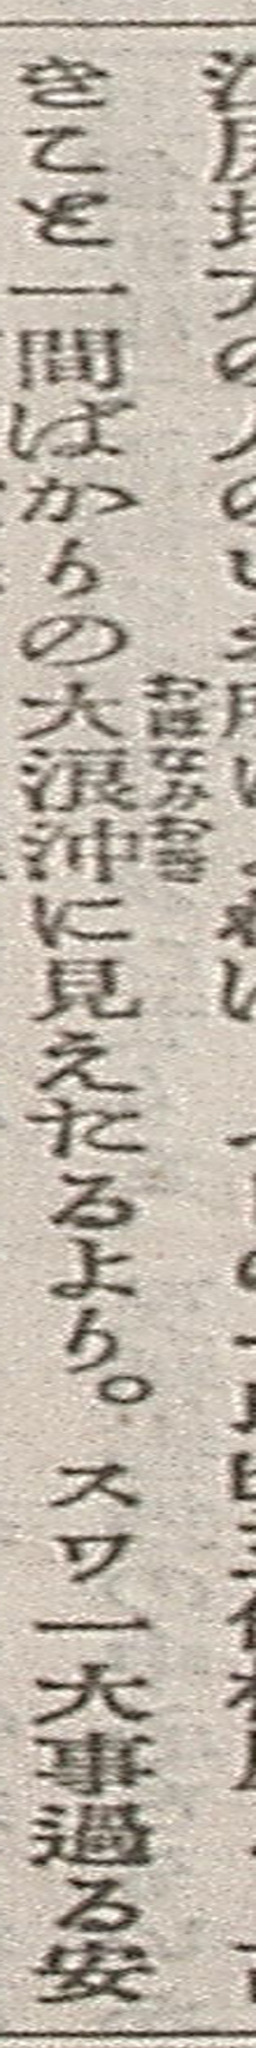きこと一間ばかりの大浪沖に見えたるより。スワ一大事過る安
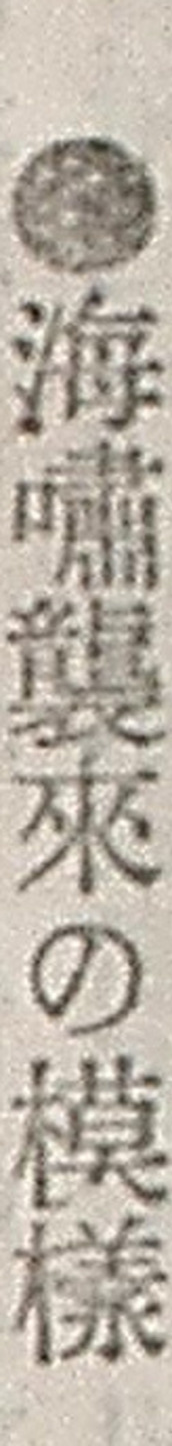●海嘯襲来の模様
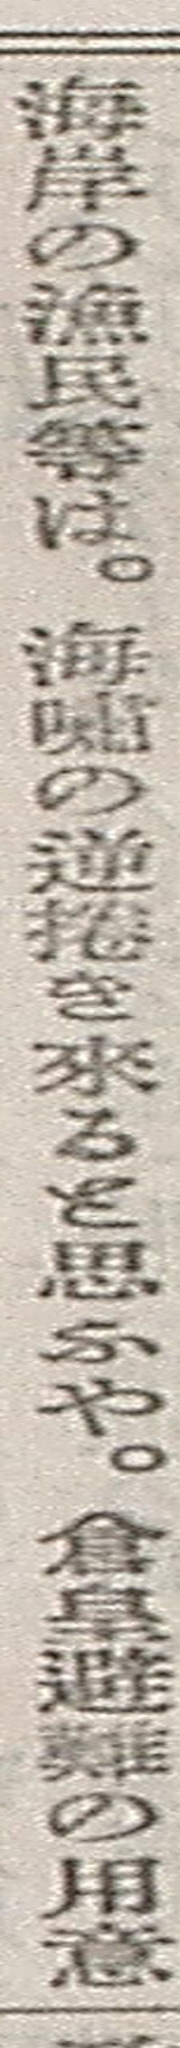海岸の漁民等は。海嘯の逆捲き来ると思ふや。倉皇避難の用意
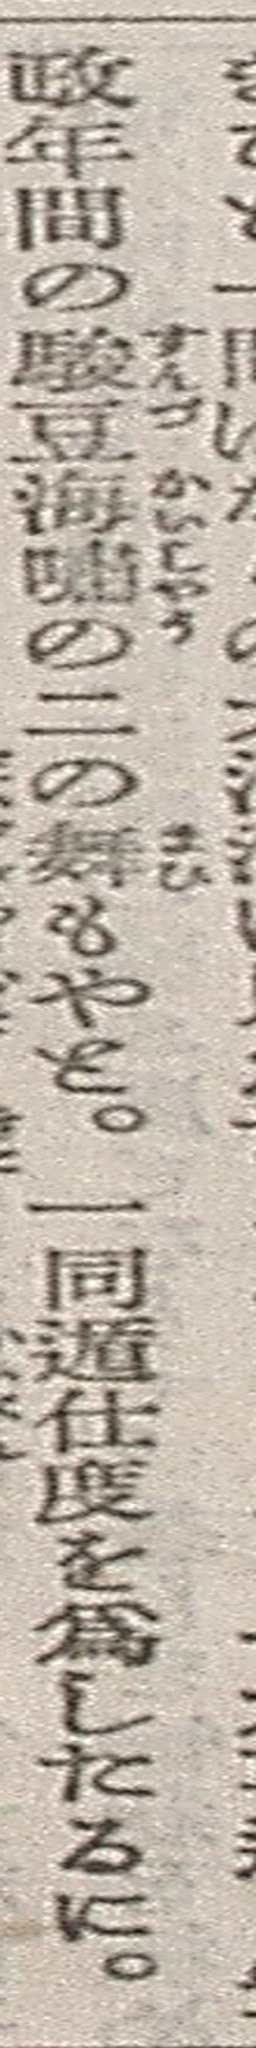政年間の駿豆海嘯の二の舞もやと。一同遁仕度を為したるに。
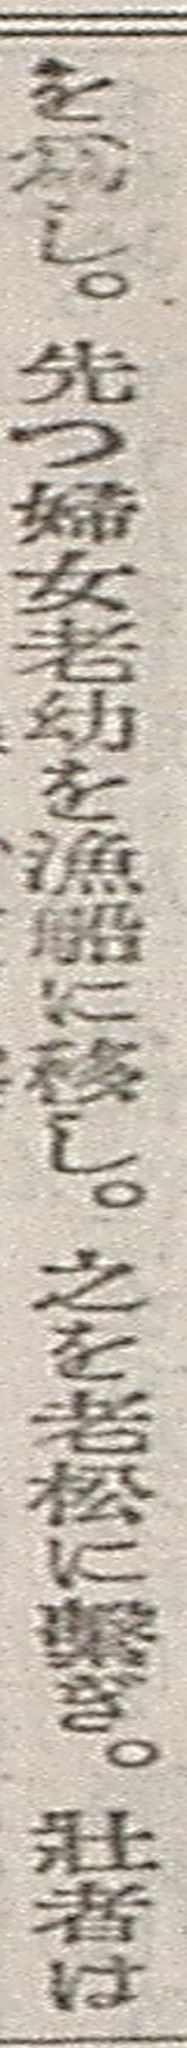を為し。先つ婦女老幼を漁船に移し。之を老松に繋ぎ。壮者は
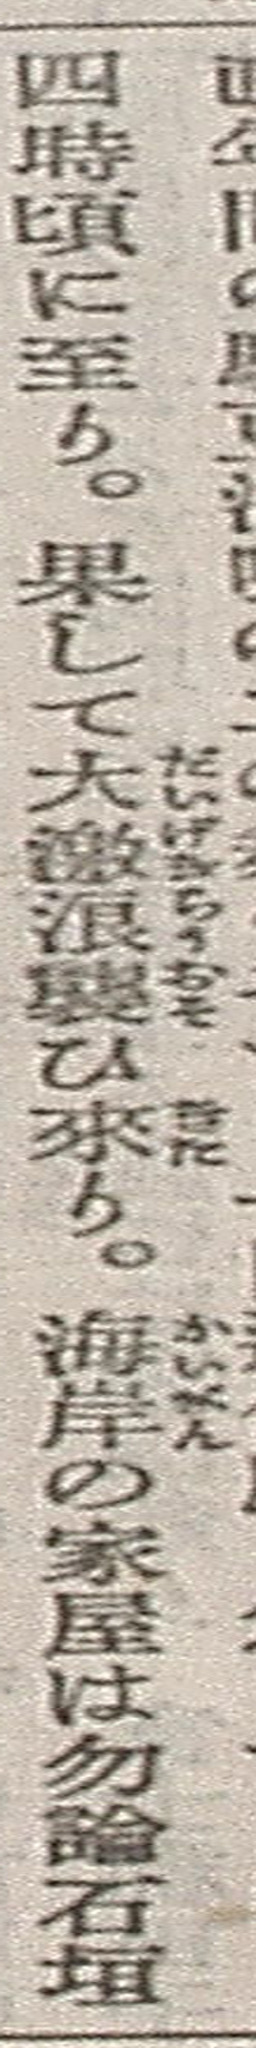四時頃に至り。果して大激浪襲ひ来り。海岸の家屋は勿論石垣
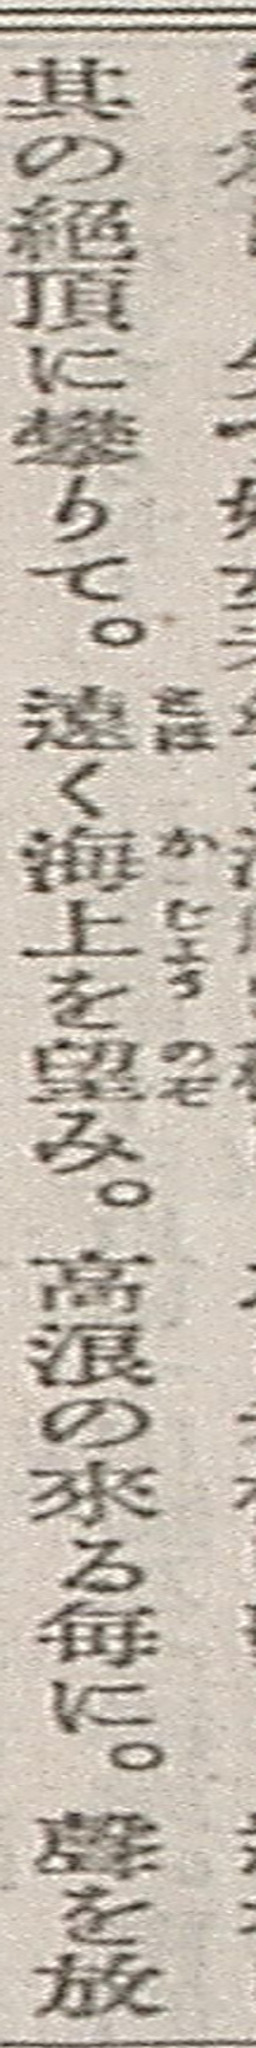其の絶頂に挙りて。遠く海上を望み。高浪の来る毎に。声を放
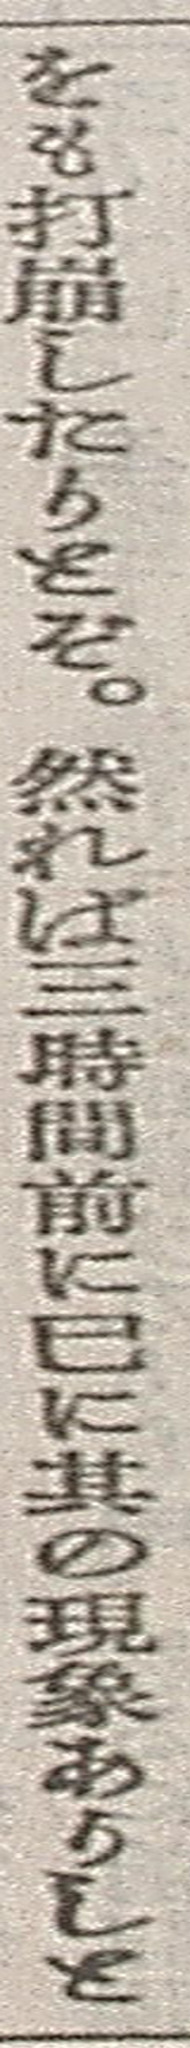をも打崩したりとぞ。然れば三時間前に已に其の現象ありしと
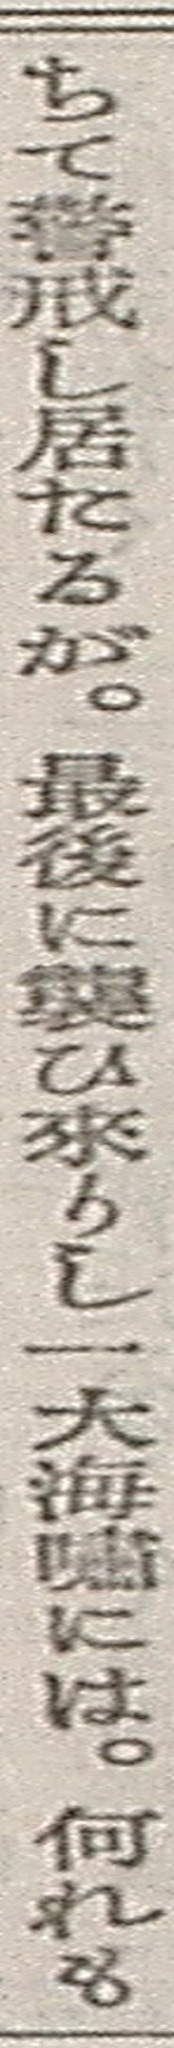ちて警戒し居たるが。最後に襲ひ来りし一大海嘯には。何れも
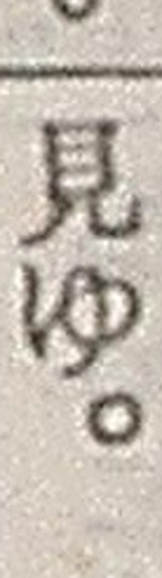見ゆ。
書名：風俗畫報臨時増刊第百九十九號　明治三十二年十月各地災害圖會（前編之續）
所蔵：東京大学地震研究所図書室 Earthquake Research Institute Library, The University of Tokyo, JAPAN
